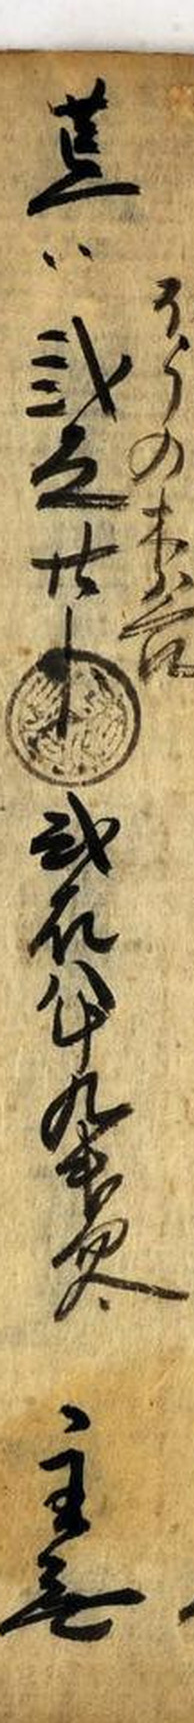荒同弐反廿分㊞弐石八斗九升四合主無
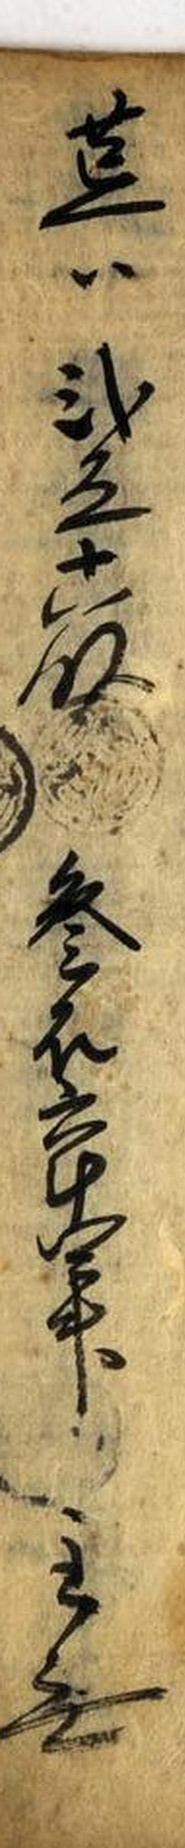荒同弐反六畝㊞参石六斗四升主無
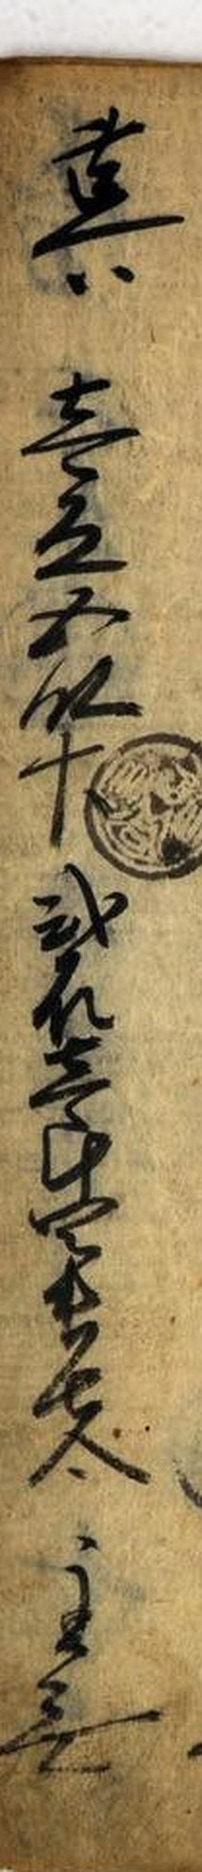荒同壱反五畝分㊞弐石壱斗四升七合主無

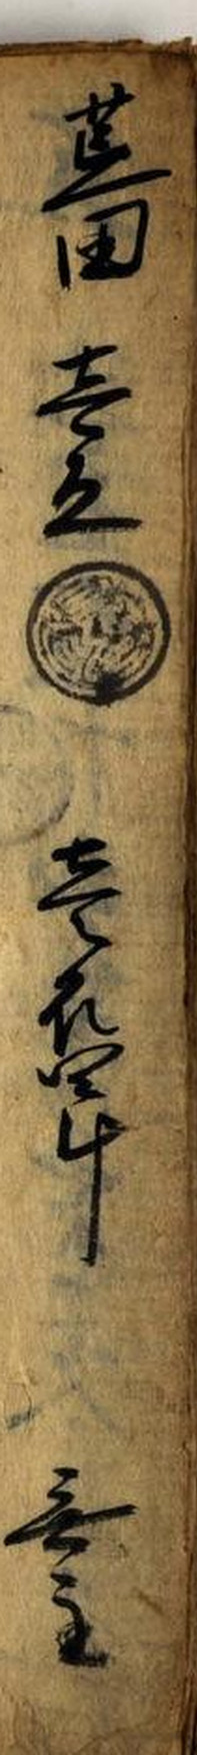荒田壱反㊞壱石四斗無主
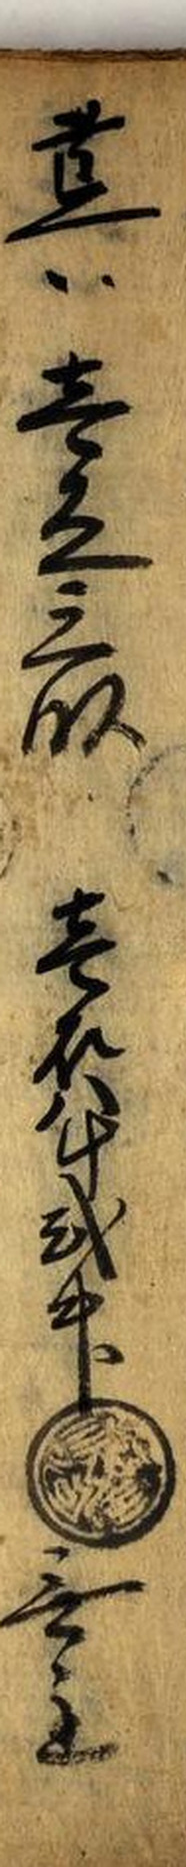荒同壱反三畝㊞壱石八斗弐升㊞無主
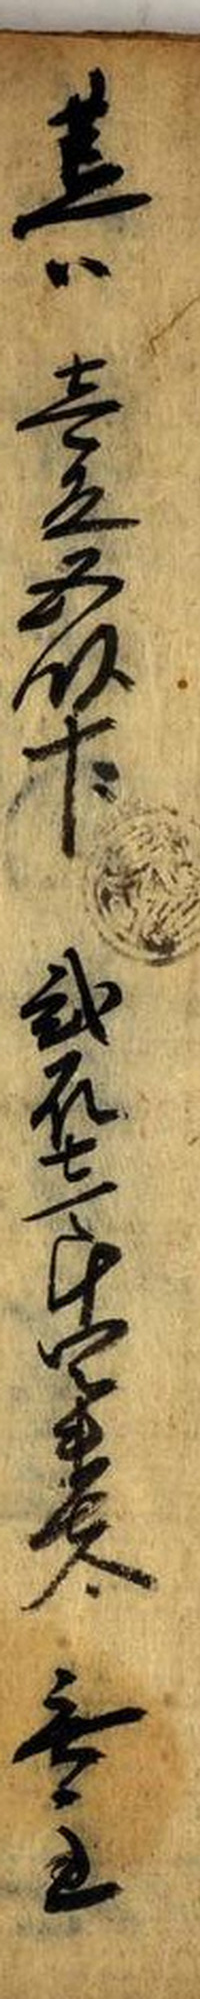荒同壱反五畝十分㊞弐石壱斗四升七合無主
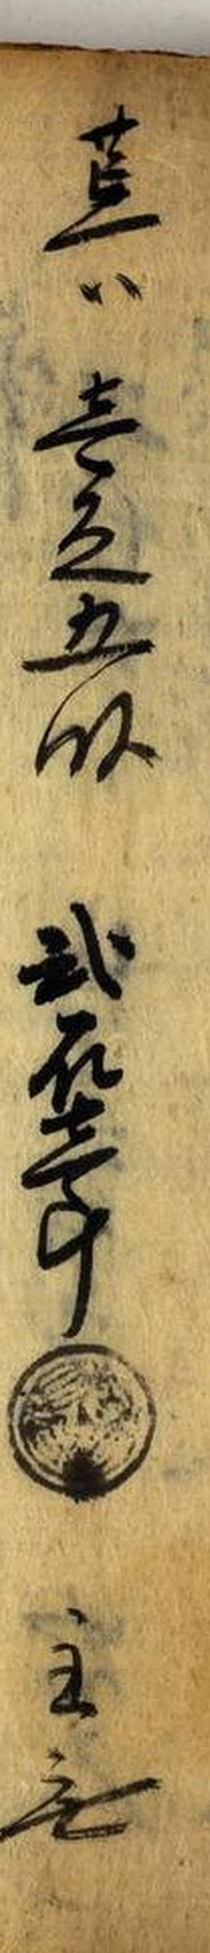荒同壱反五畝弐石壱斗㊞主無
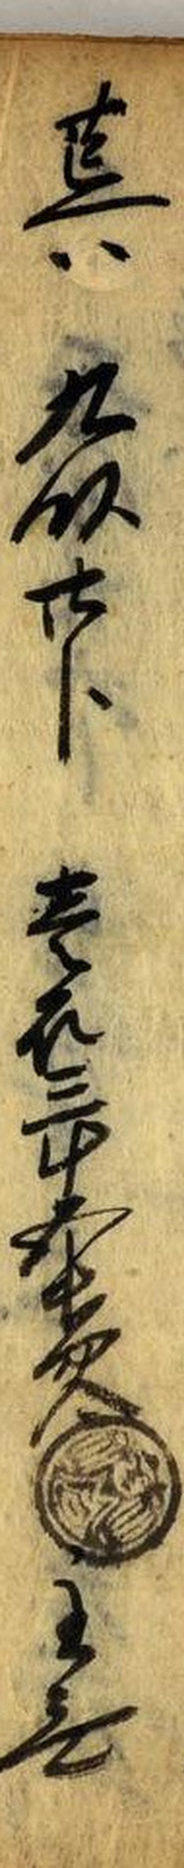荒同九畝廿分壱石三斗五升四合㊞主無
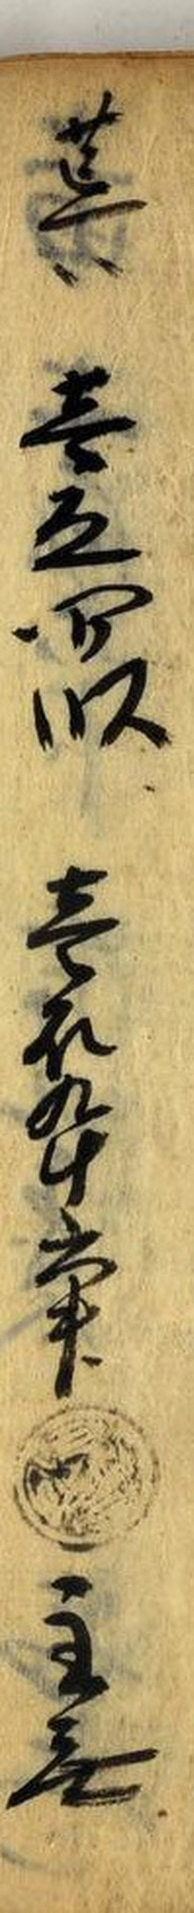荒同壱反四畝壱石九斗六升㊞主無
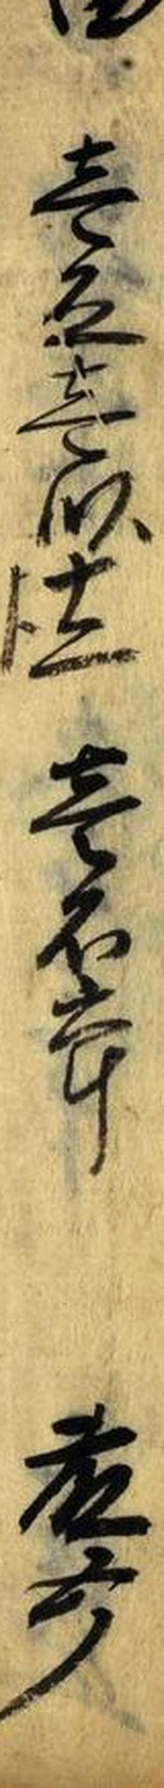下田壱反壱畝十二分壱石六斗藤五郎
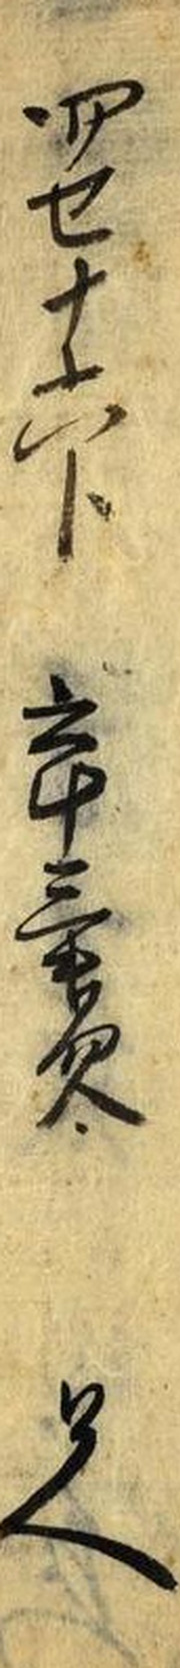同四セ十六分六斗三升四合同人
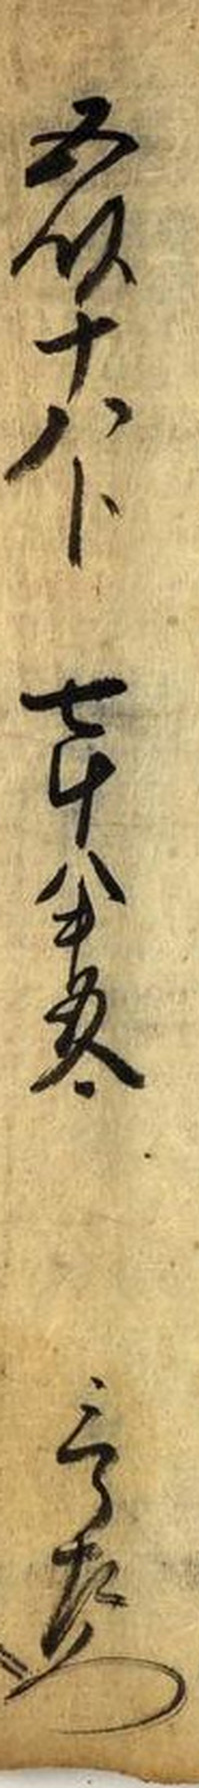同五畝十八分七斗八升五合三郎左衛門
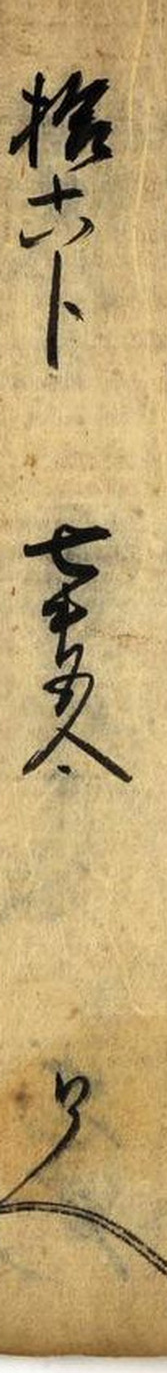同拾六分七升五合同人
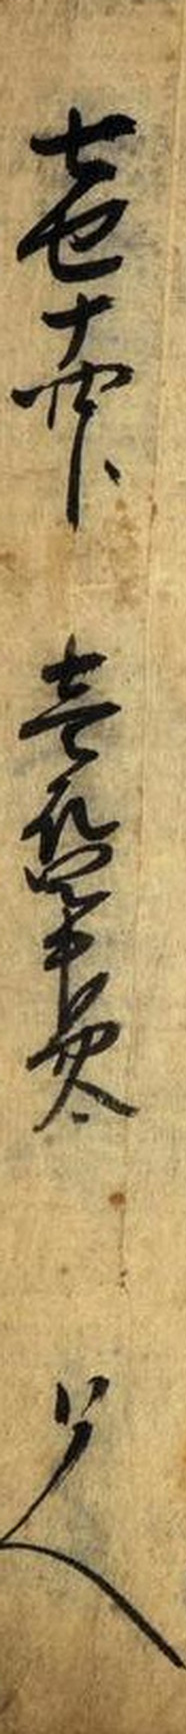同七セ十四分壱石四升四合同人
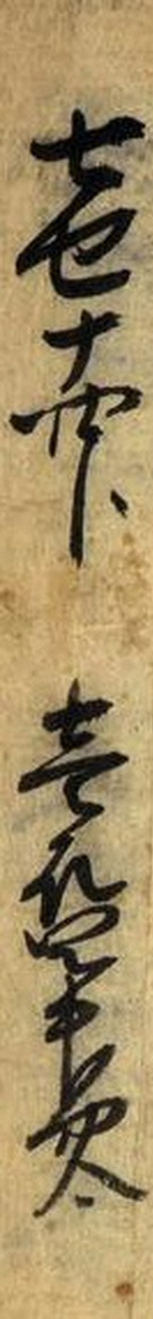同七セ十四分壱石四升四合同人

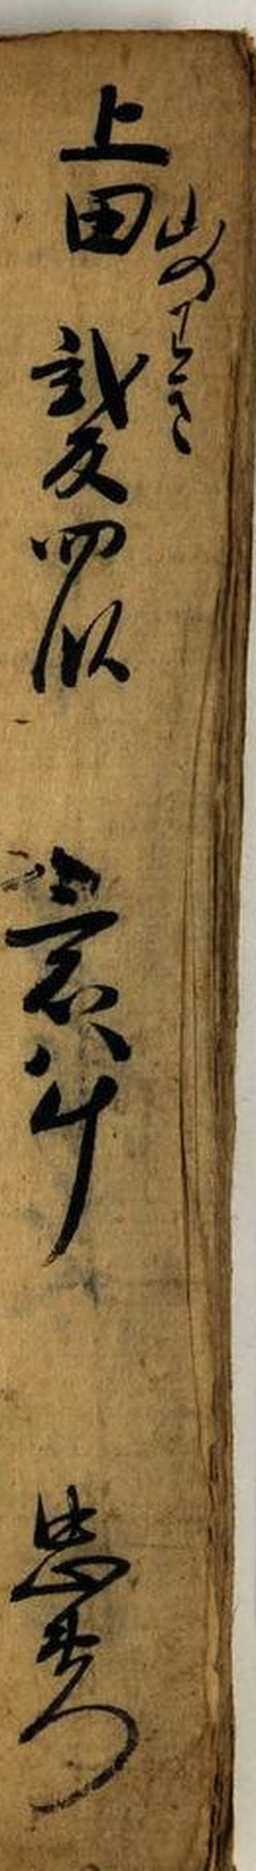上田弐反四畝三石八斗忠右衛門
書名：越前国西方内志津庄内本折村御検地帳
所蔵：福井県文書館 Fukui Prefectural Archives
